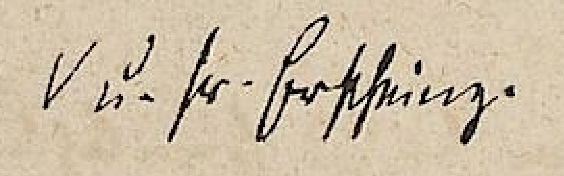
V u. sr. Erscheing.
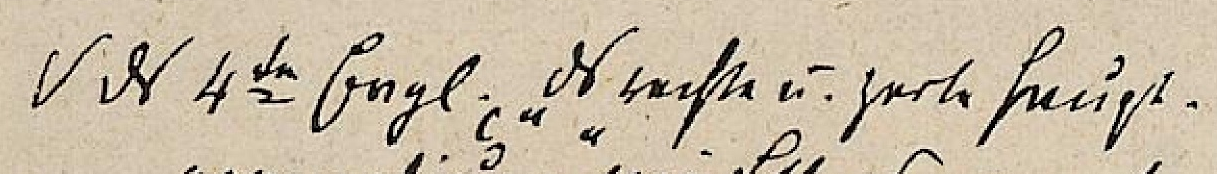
V ds 4te Evgl., ds rechte u. jerte Haupt.
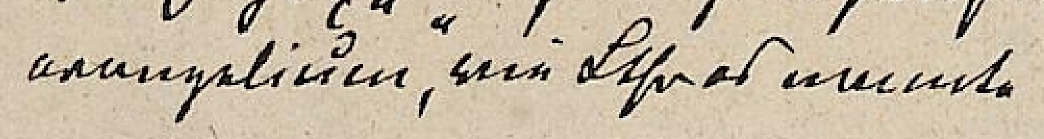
evangelium wie Lthr es nannte
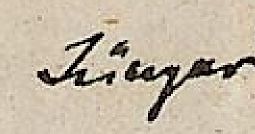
Jünger
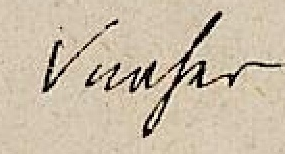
V naher
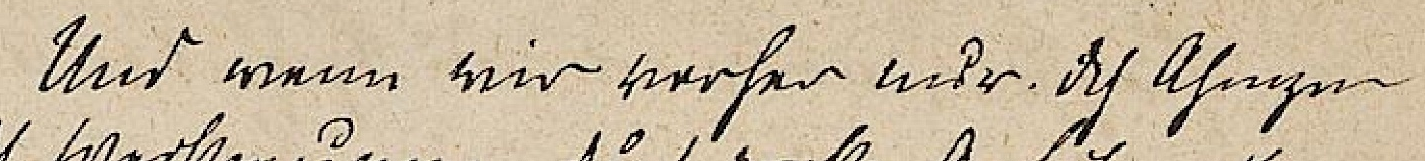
Und wenn wir vorher nur dch Ahngn
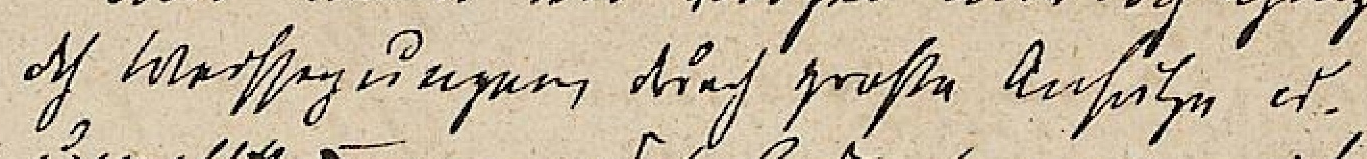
dch Weissagungen, durch große Ansätze u.
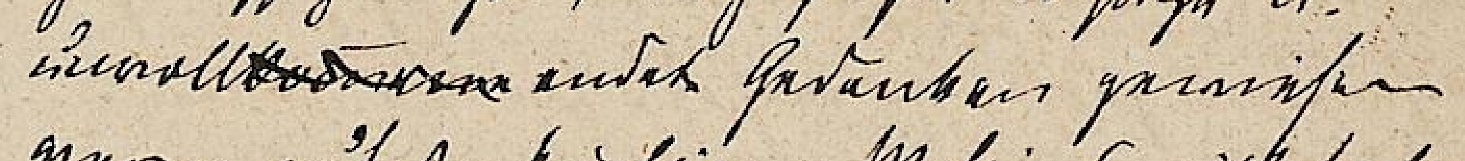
unvollkommen endete Gedenken gewiesen
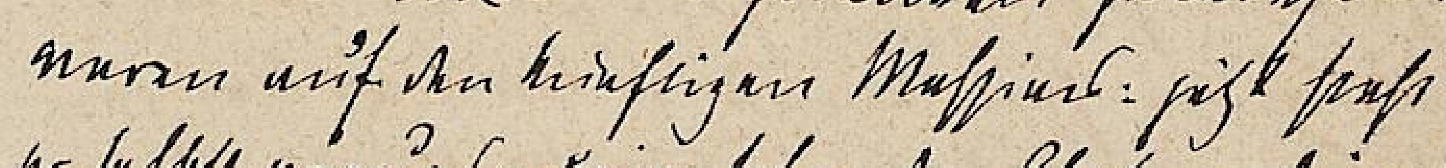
waren auf den künftigen Messias, jetzt steht
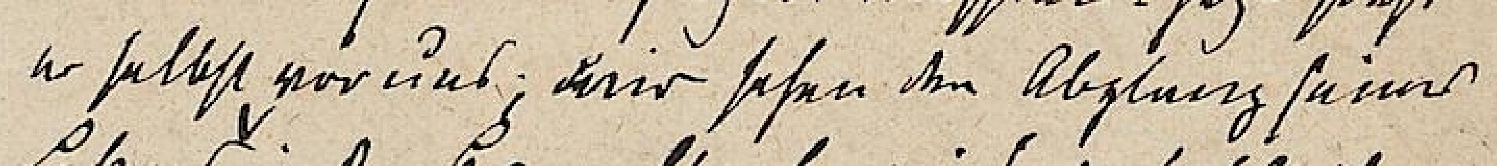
er selbst vor uns; wir sehen den Abglanz seines
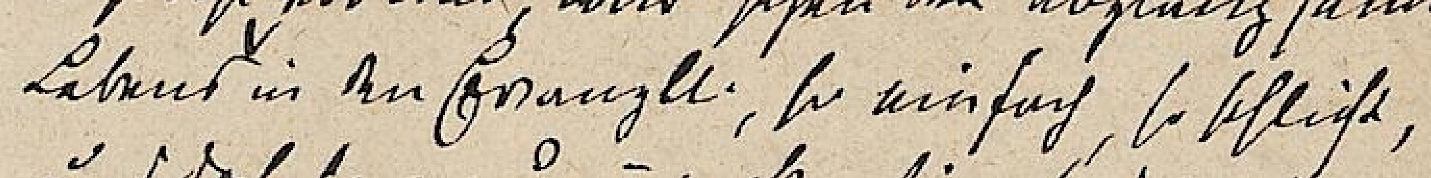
Lebens in den Evangll., so einfach, so schlicht,
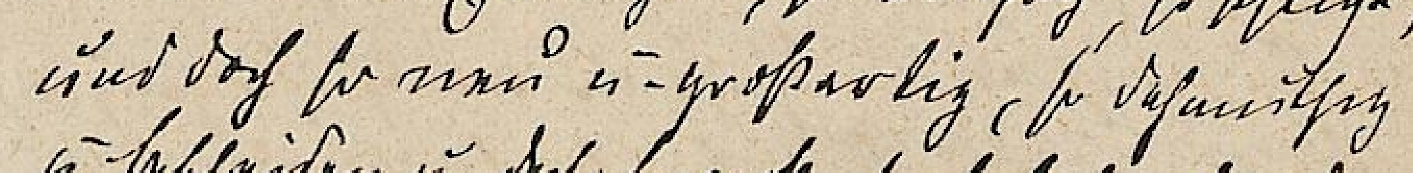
und doch so neu u. großartig, so dehmüthig
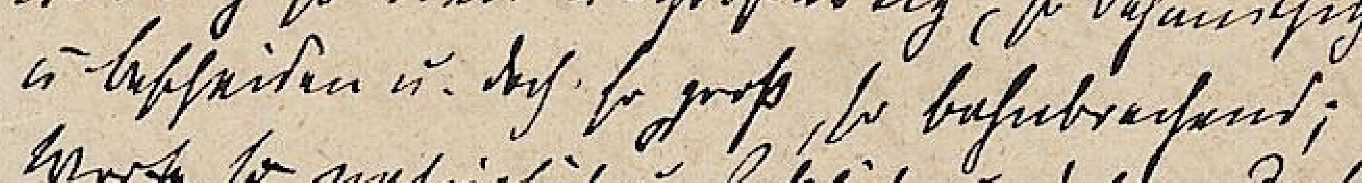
u. bescheiden u. doch so groß, so bahnbrechend;
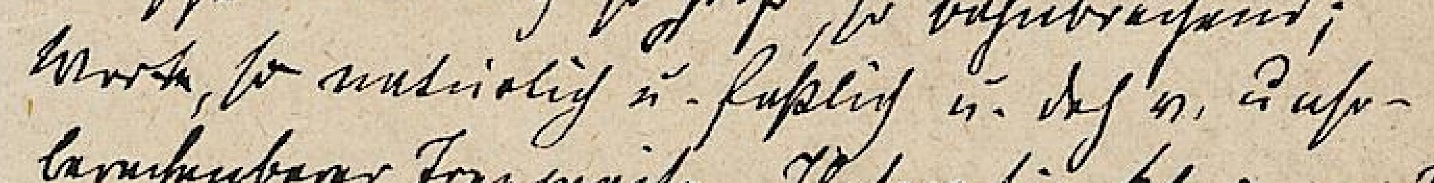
Worte, so natürlich u. faßlich u. doch v. unso¬
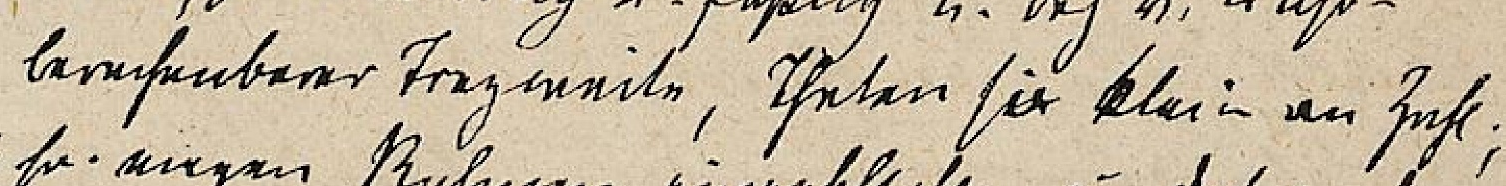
berechenbarer Tragweite, Thaten so klein an Zahl;
